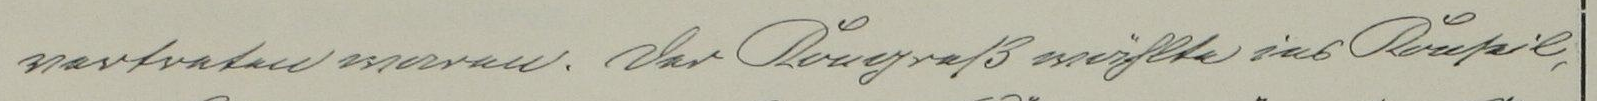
vertreten waren. Der Kongreß wählte ins Konseil,
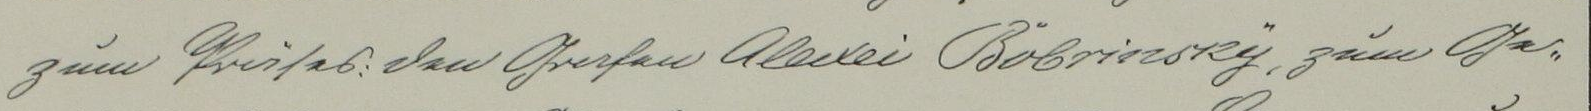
zum Präses: den Grafen Alexei Bobrinsky, zum Ge-
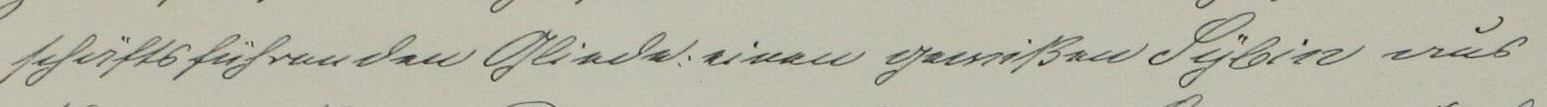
schäftsführenden Gliede: einen gewißen Sybin aus
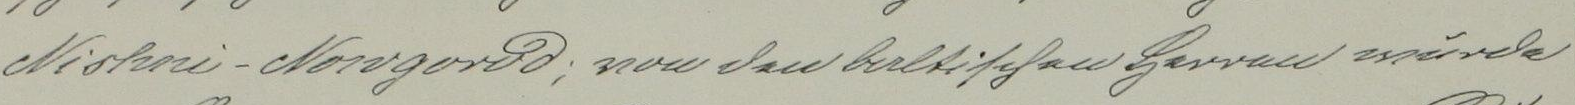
Nishni-Nowgorod; von den baltischen Herren wurde
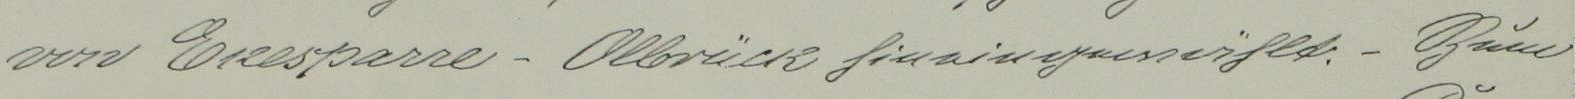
von Ekesparre-Olbrück hineingewählt. – Zum
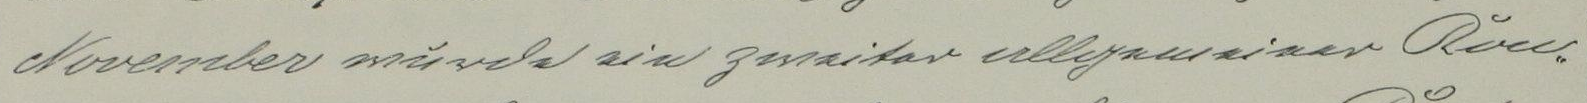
November wurde ein zweiter allgemeiner Kon-
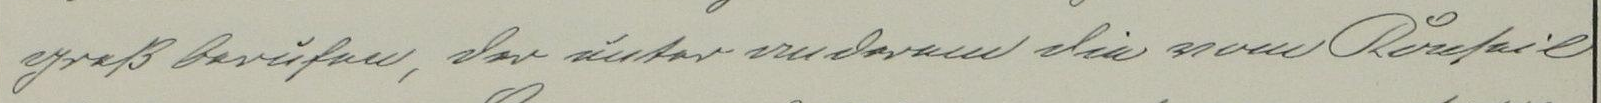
greß berufen, der unter anderem die vom Konseil
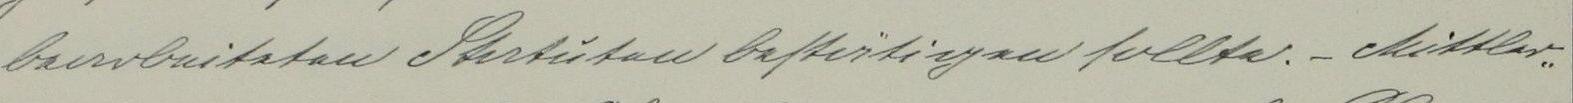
bearbeiteten Statuten bestätigen sollte. – Mittler-
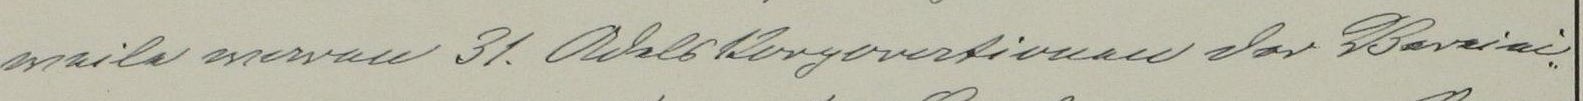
weile waren 31. Adelskorporationen der Vereini-
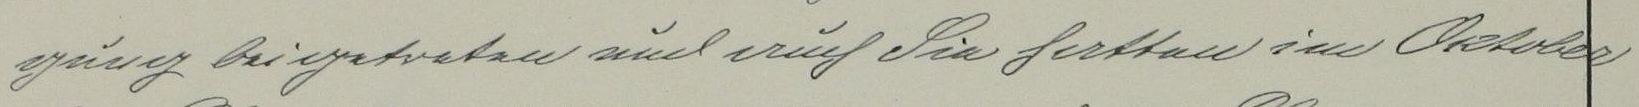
gung beigetreten und auch Sie hatten im Oktober
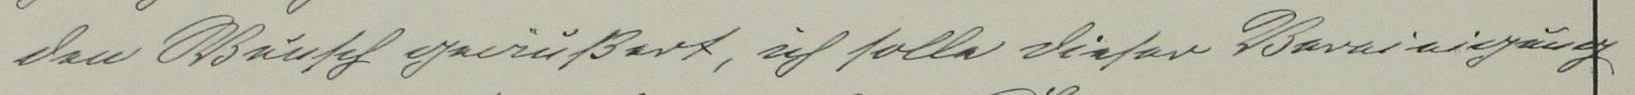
den Wunsch geäußert, ich solle dieser Vereinigung
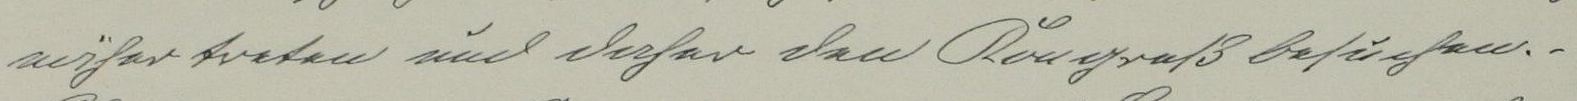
nähertreten und daher den Kongreß besuchen. -
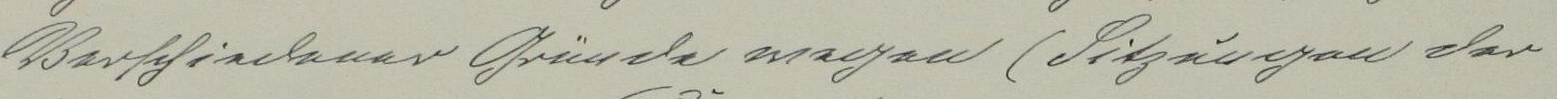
Verschiedener Gründe wegen (Sitzungen der
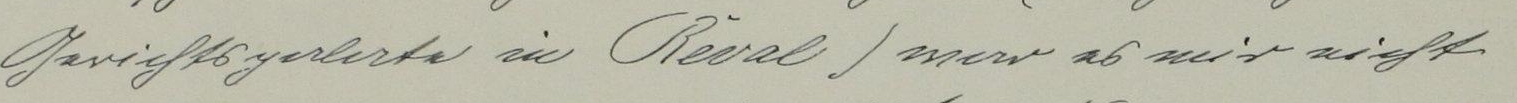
Gerichtspalate in Reval) war es mir nicht
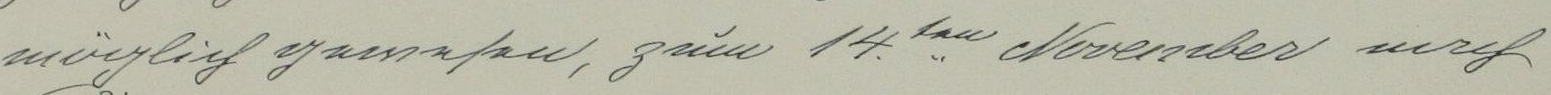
möglich gewesen, zum 14ten November nach
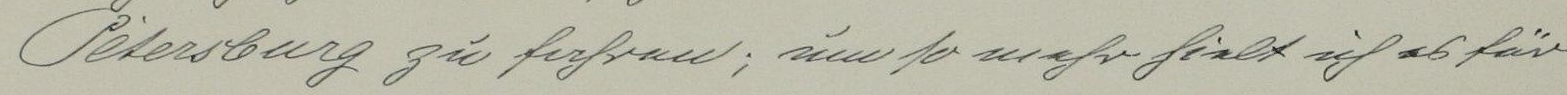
Petersburg zu fahren; umso mehr hielt ich es für
